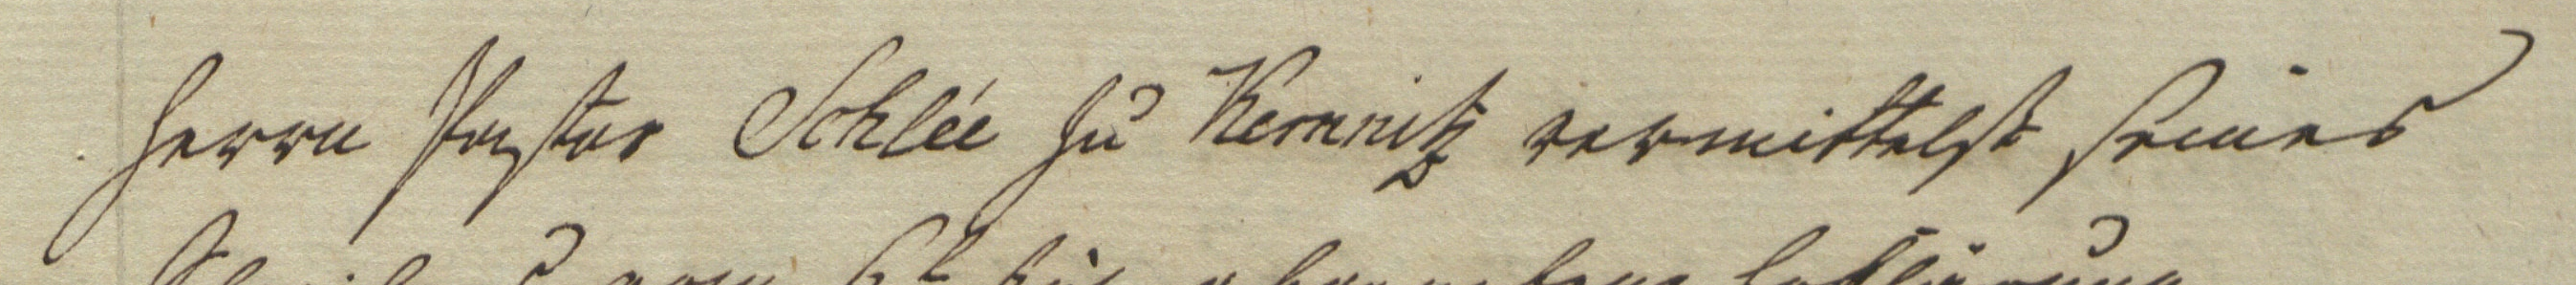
Herrn Pastor Schlée zu Kemnitz vermittelst seines
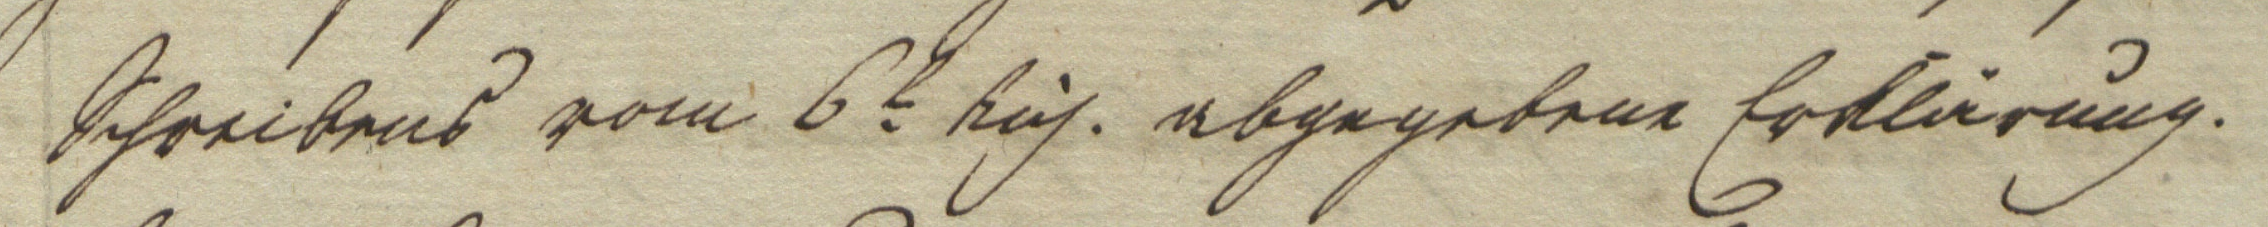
Schreibens vom 6. huj. abgegebene Erklärung
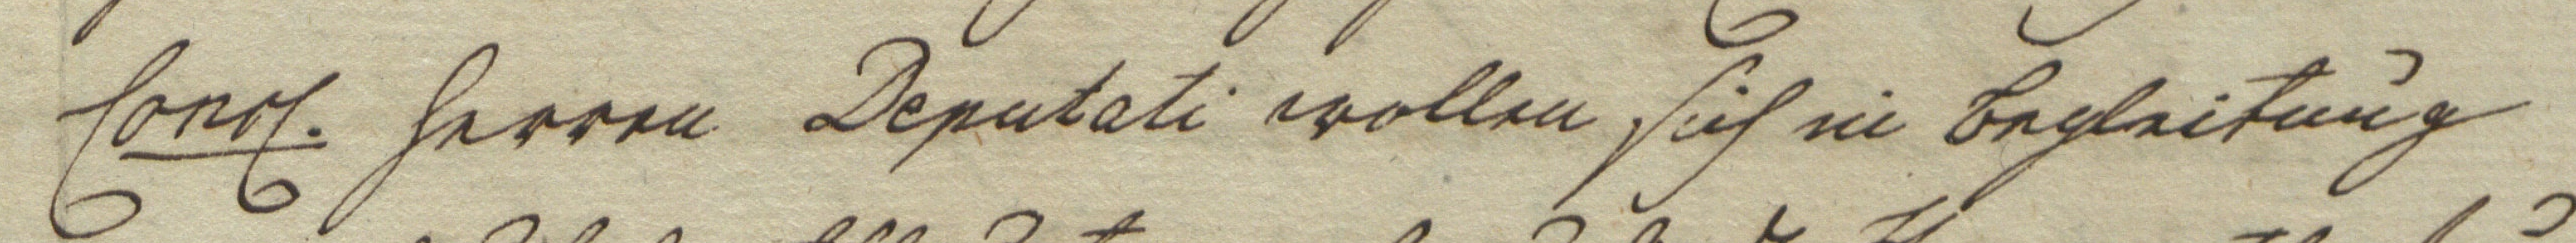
Concl. Herren Deputati wollen sich in Begleitung
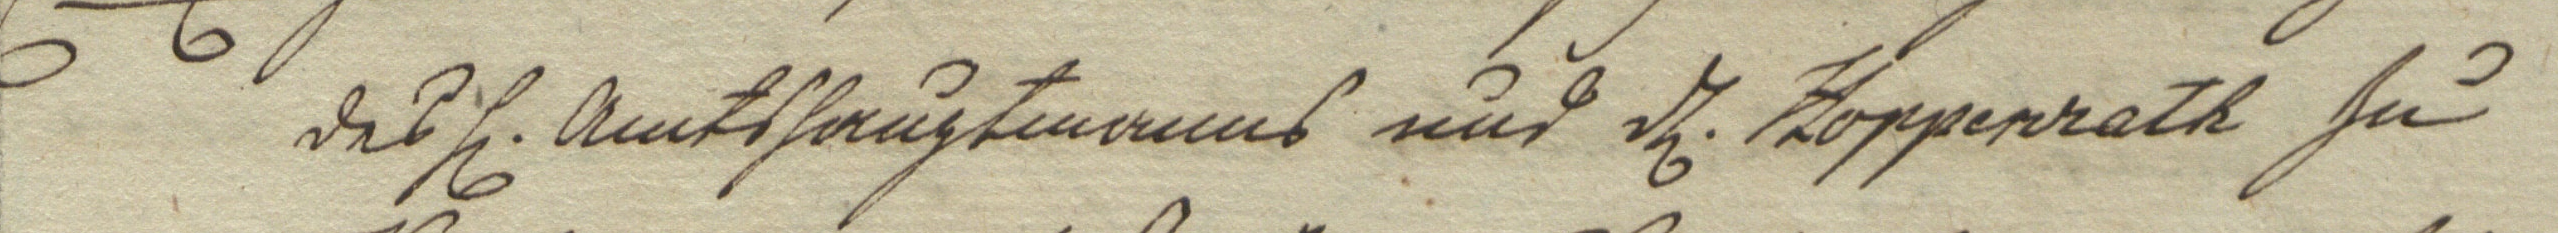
des H. Amtshauptmanns und dh. Hoppenrath zu
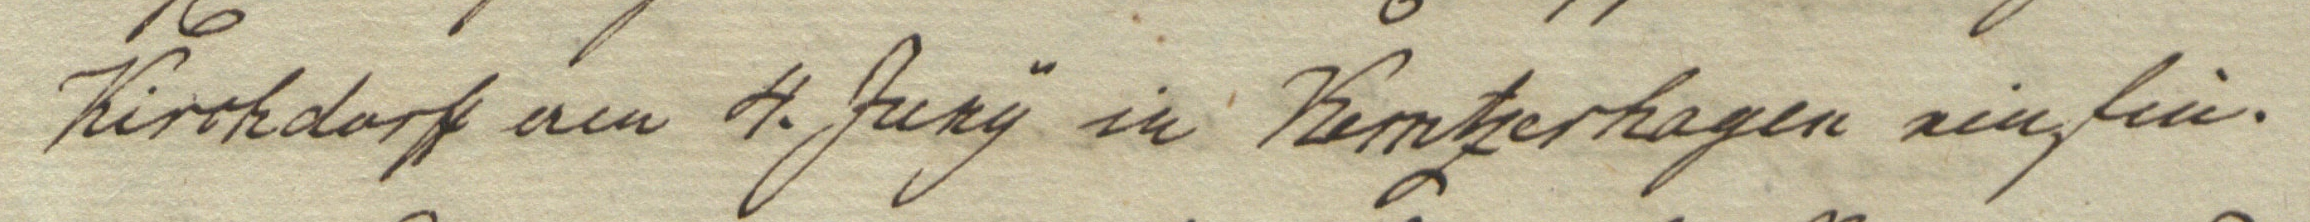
Kirchdorff am 4. Juny in Kemtzerhagen einfin¬
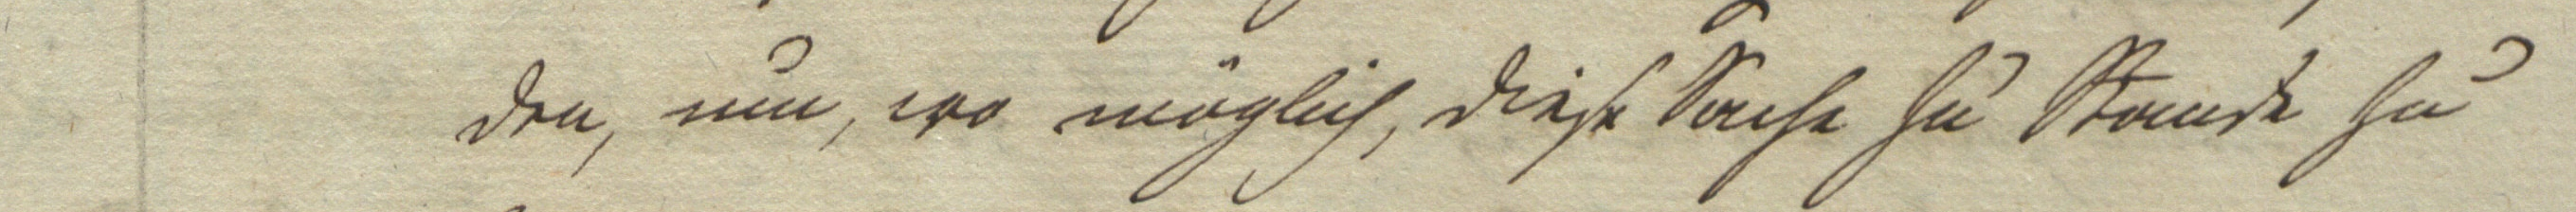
den, um, wo möglich, diese Sache zu Stande zu
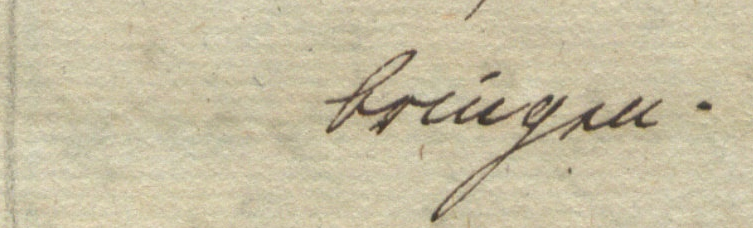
bringen.
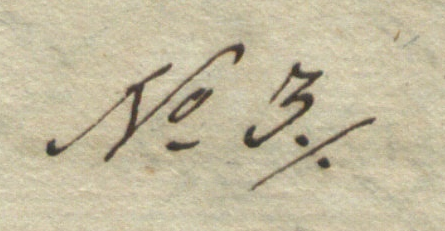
No. 3./.
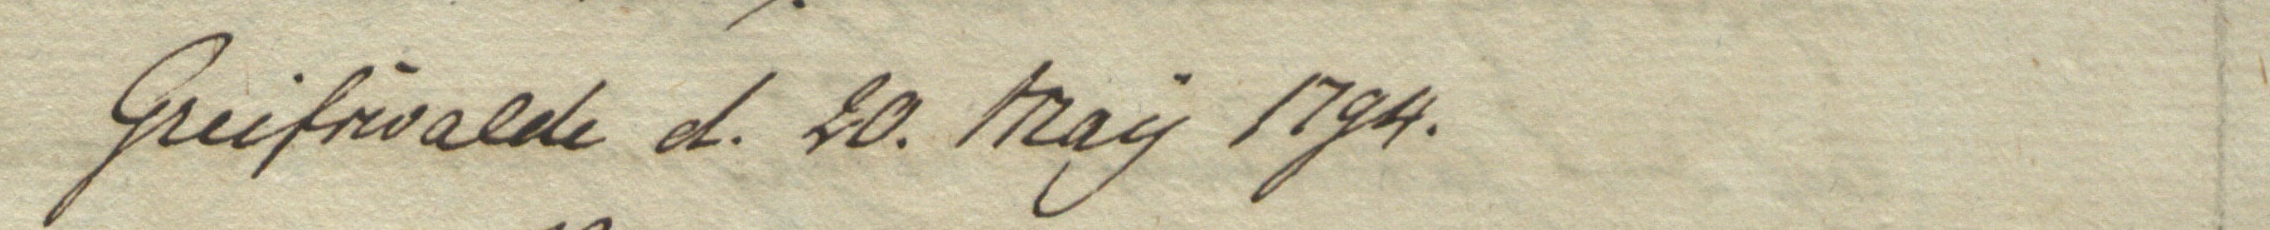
Greifswalde d. 20. May 1794
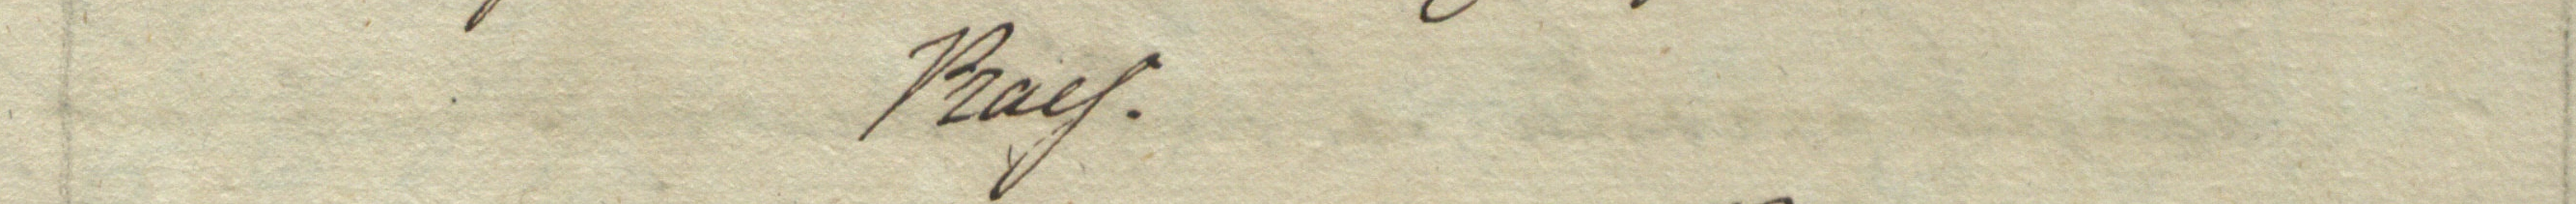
Praes.
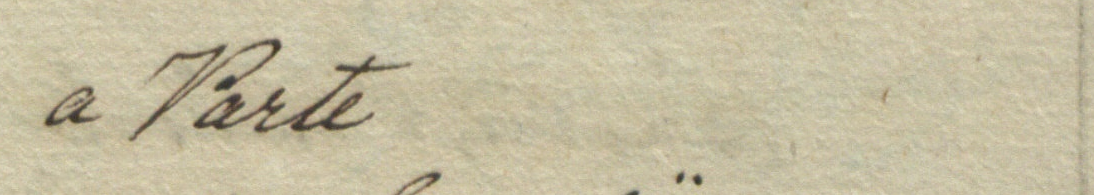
a Parte
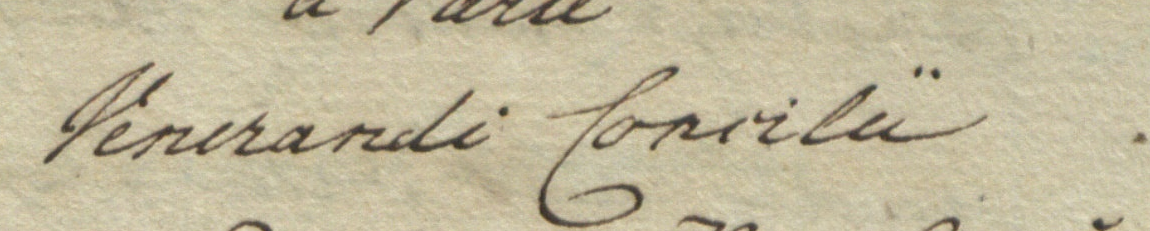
Venerandi Concilii
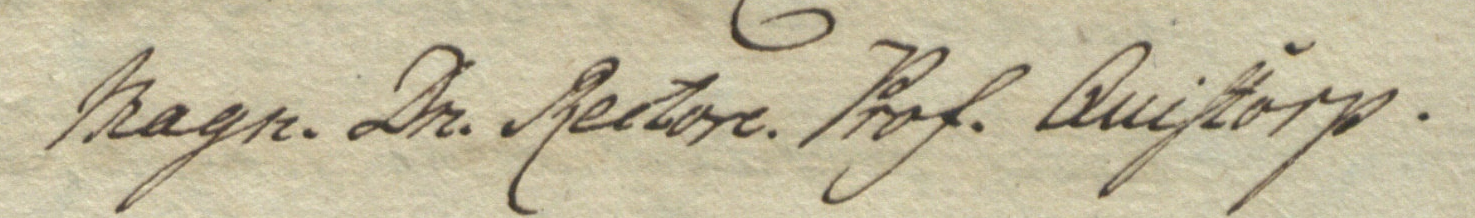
Magn. Dn. Rectore. Prof. Quistorp
